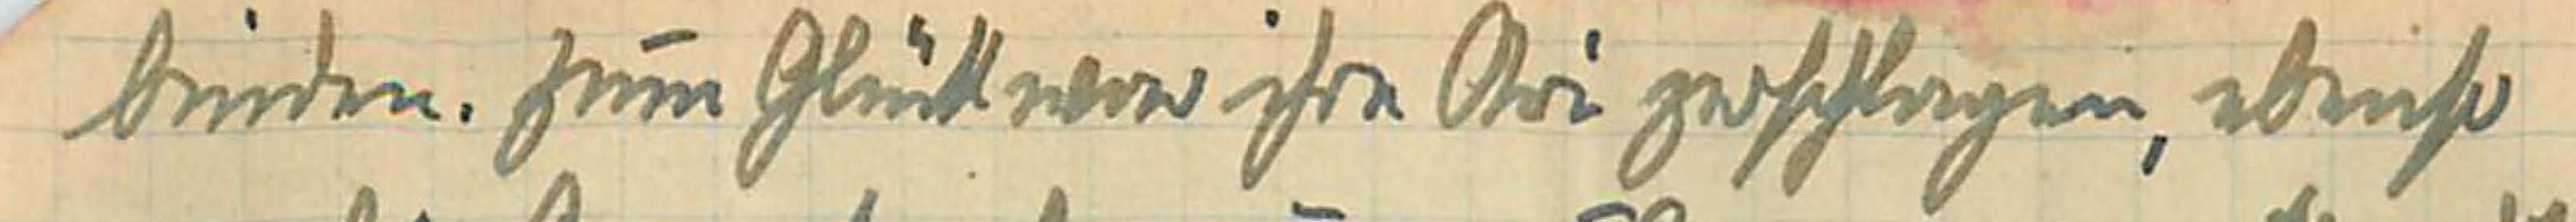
binden. Zum Glück war ihre Ari zerschlagen, ebenso
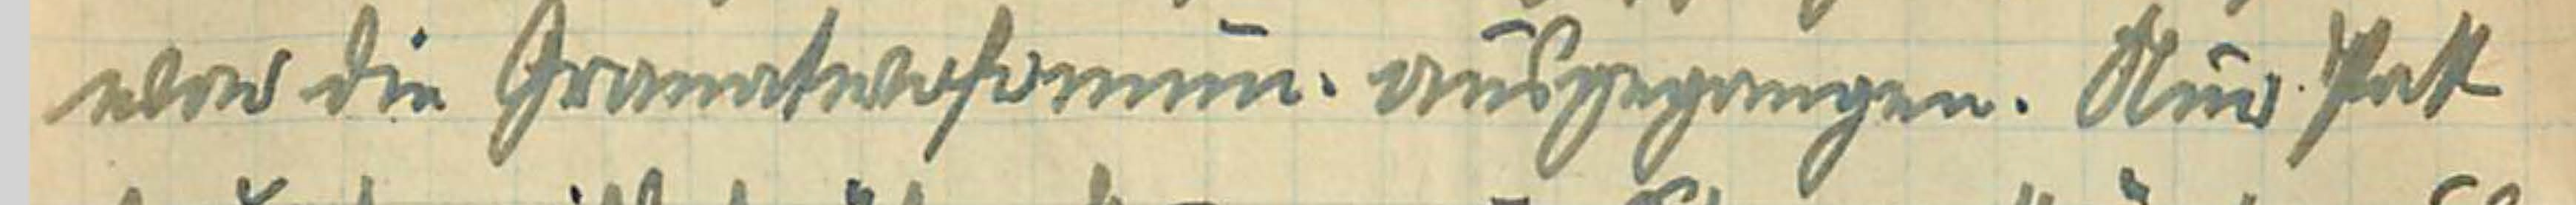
war die Granatwerfermun. ausgegangen. Nur Pak
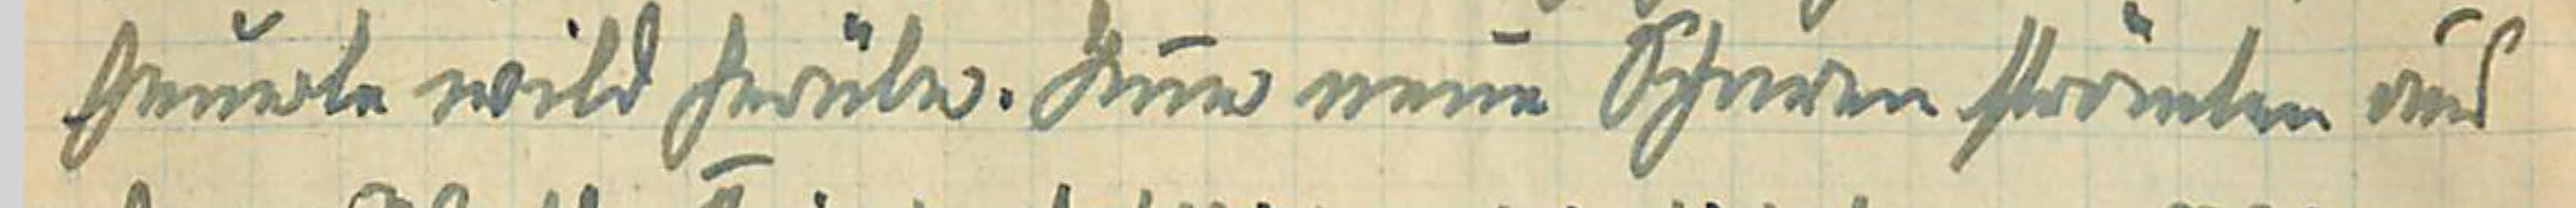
feuerte wild herüber. Immer neue Scharen strömten aus
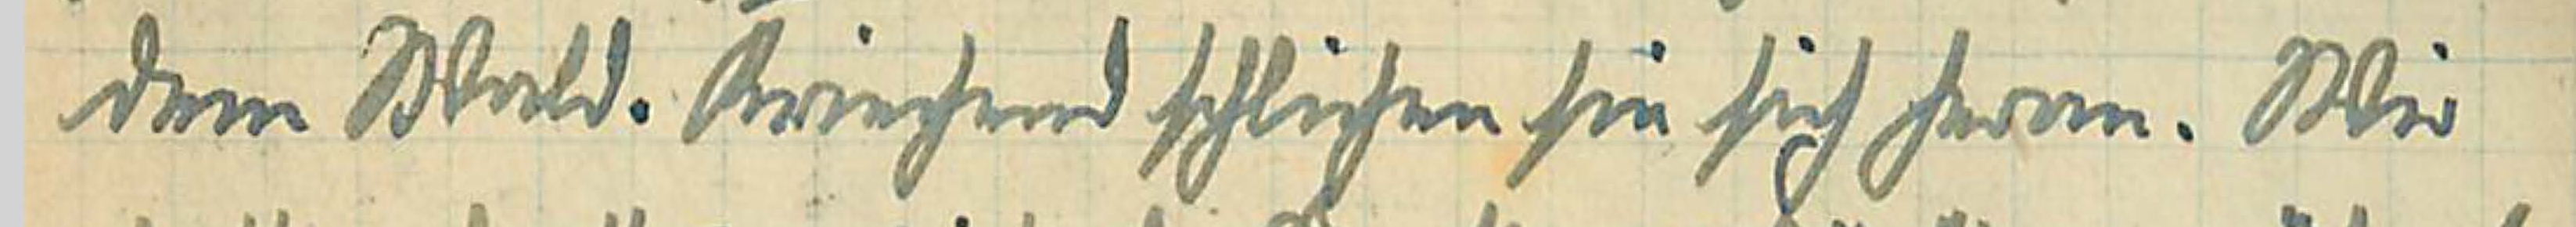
dem Wald. Kriechend schlichen sie sich heran. Wir
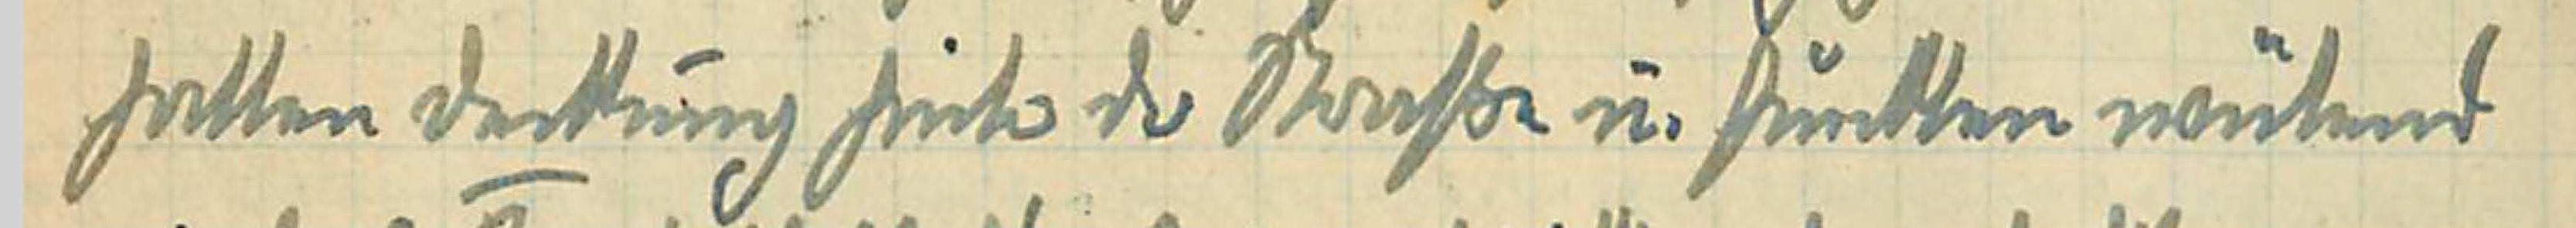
hatten Deckung hinter der Straße u. funken wütend
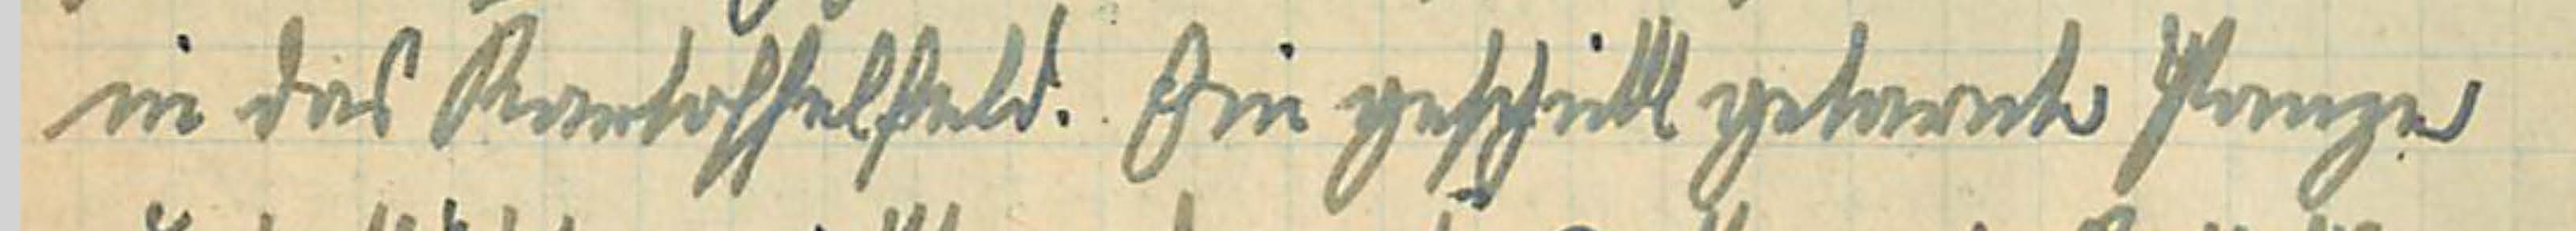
in das Kartoffelfeld. Ein geschickt getarnter Panzer
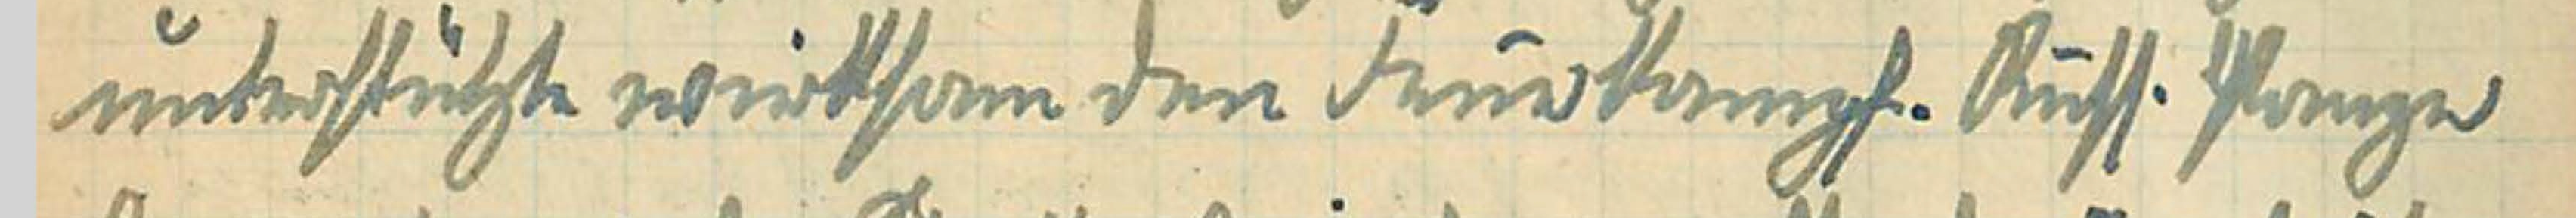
unterstützte wirksam den Feuerkampf. Russ. Panzer
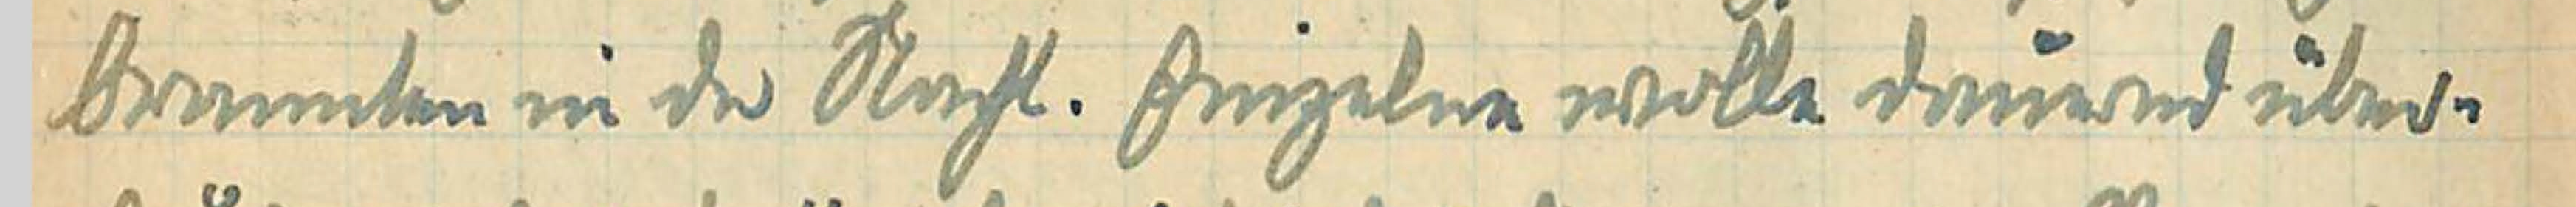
brannten in der Nacht. Einzelne wollen dauernd über-
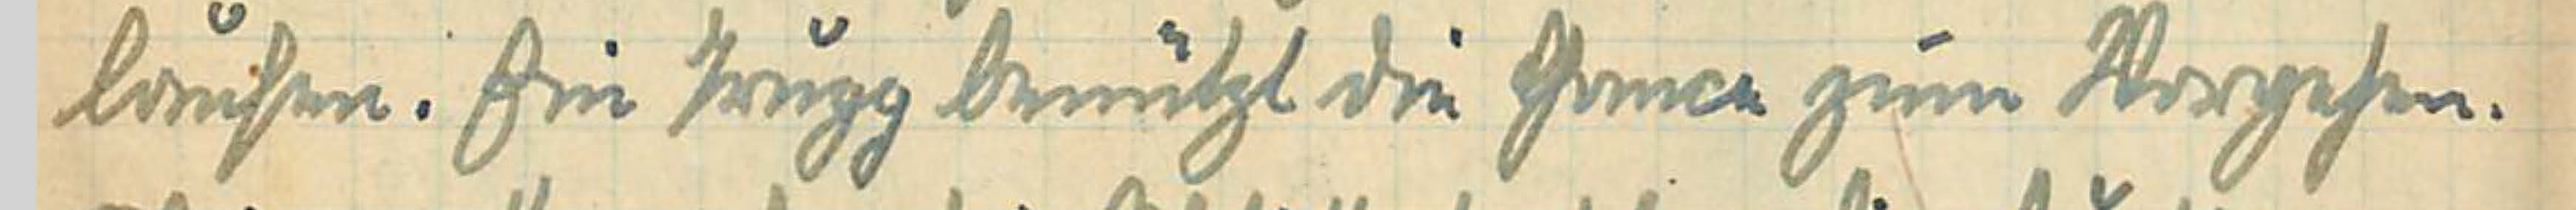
laufen. Ein Trupp benützt die Chance zum Vorgehen.
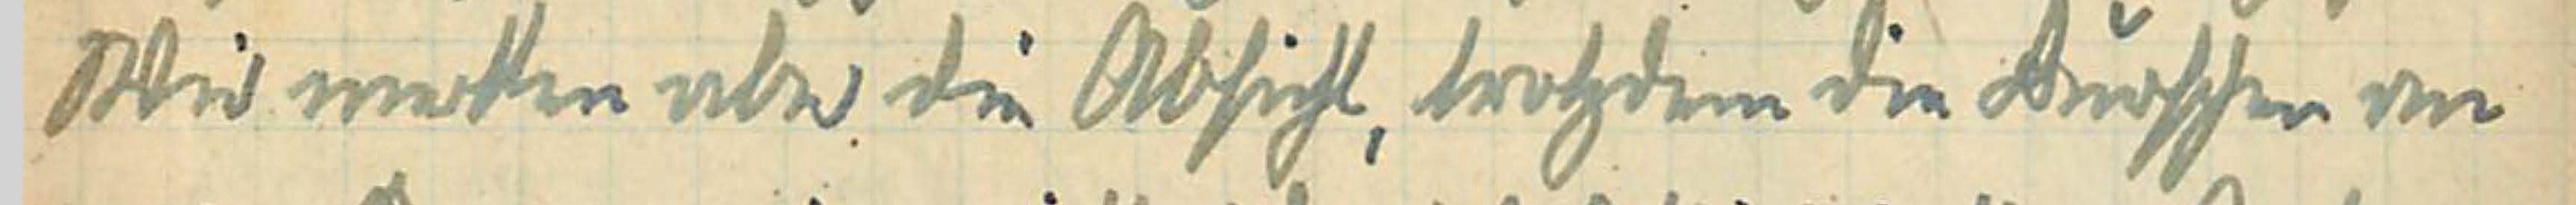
Wir merken aber die Absicht, trotzdem die Burschen an
